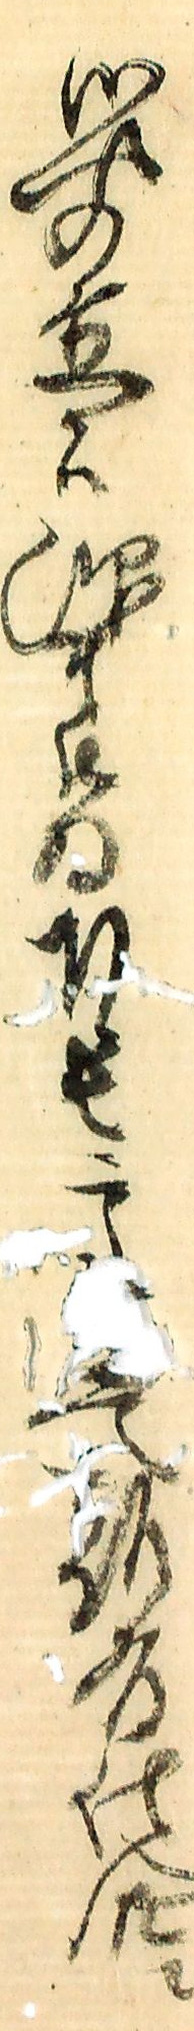御聞置被仰付被為下候は重畳難有仕合に
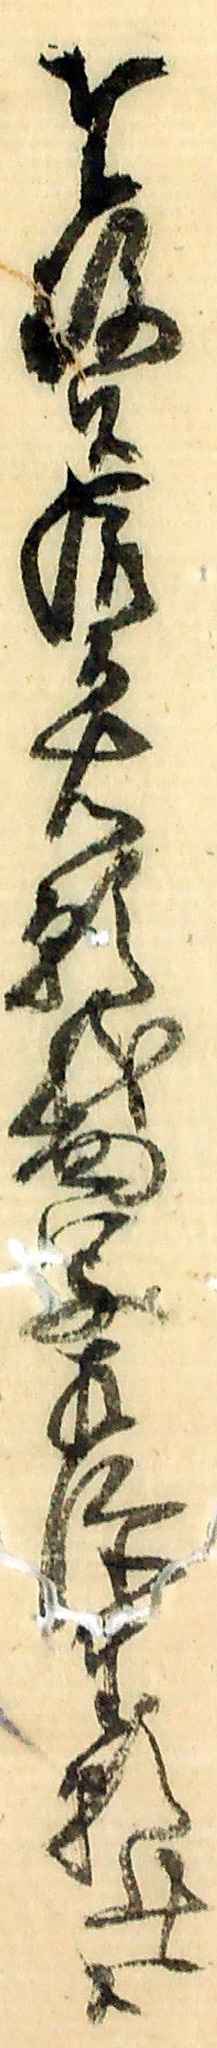奉存候依而右願紙面写相添奉願上候以上
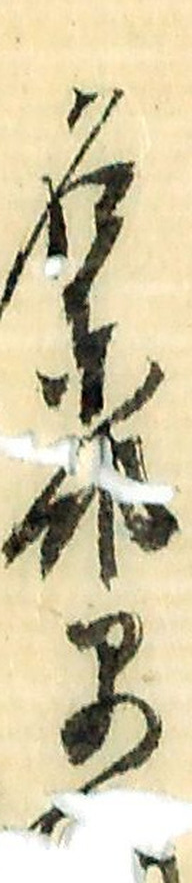名東郡早淵村
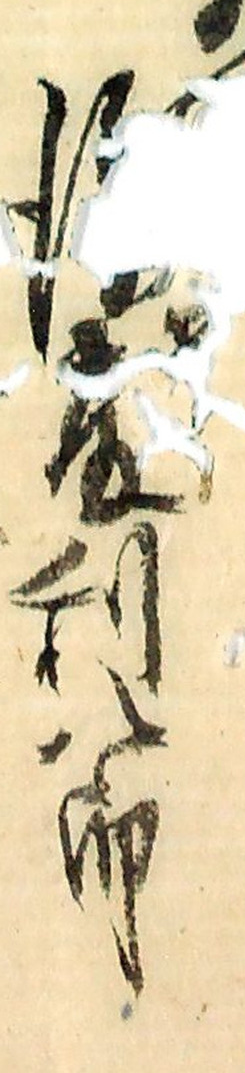後藤利八郎
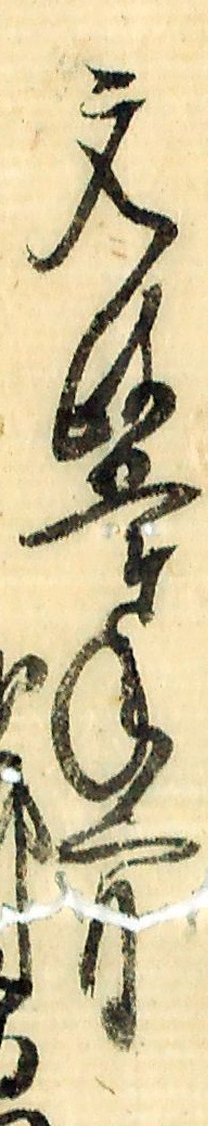文政五午年二月
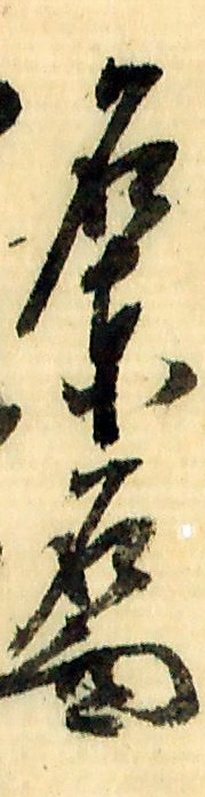名東名西
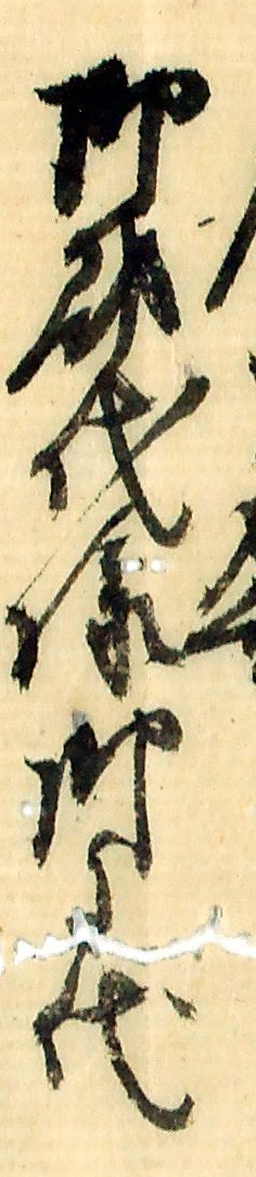御郡代様御手代
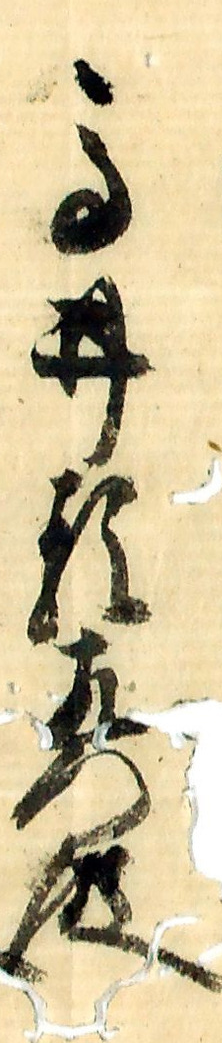高井類左衛門殿
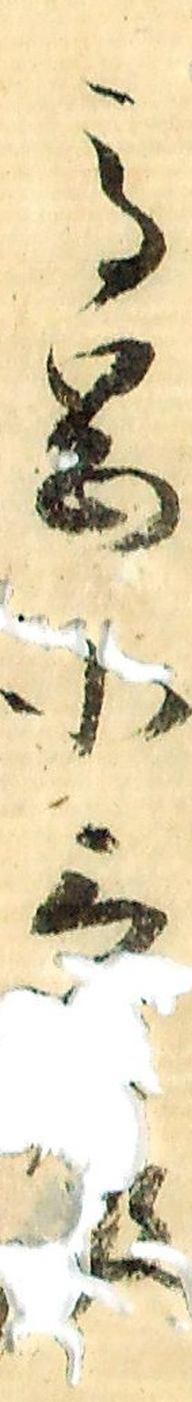高岡小三殿
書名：乍恐奉願上覚（御国産櫨植付並実取集売捌等)他
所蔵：鳴門教育大学 Naruto University of Education
